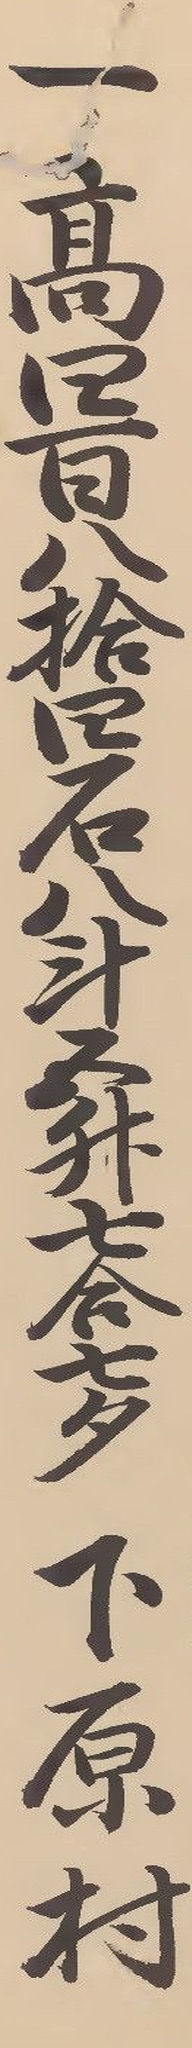一高四百八拾四石八斗五升七合七勺下原村
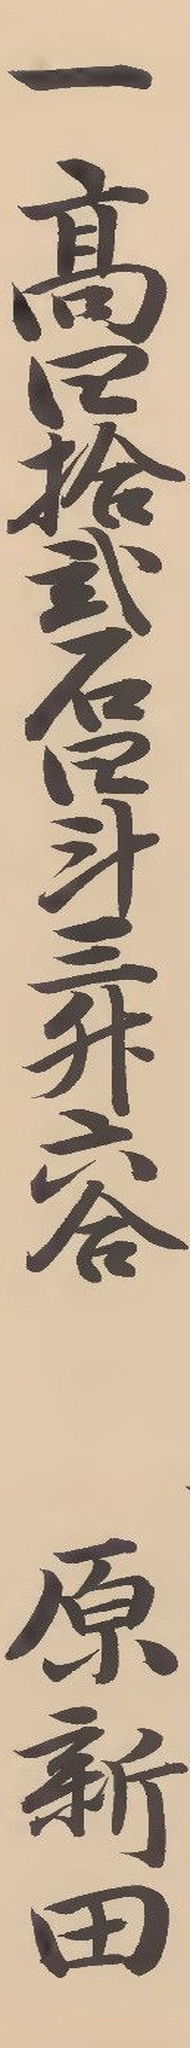一高四拾弐石四斗三升六合原新田
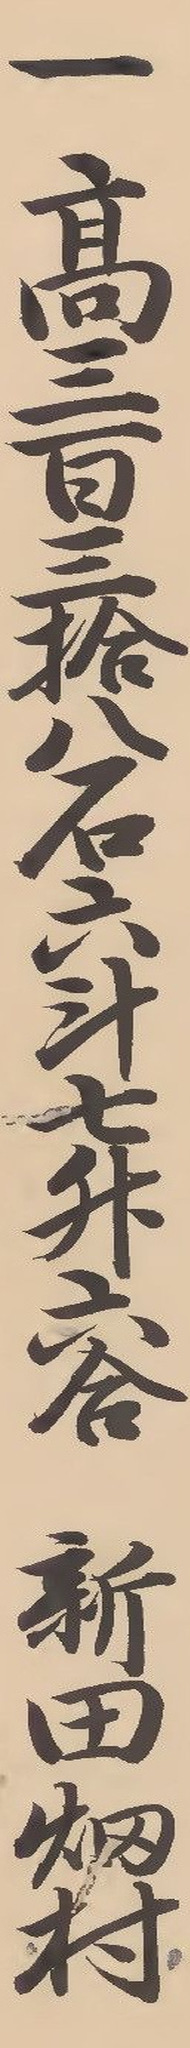一高三百三拾八石六斗七升六合新田畑村

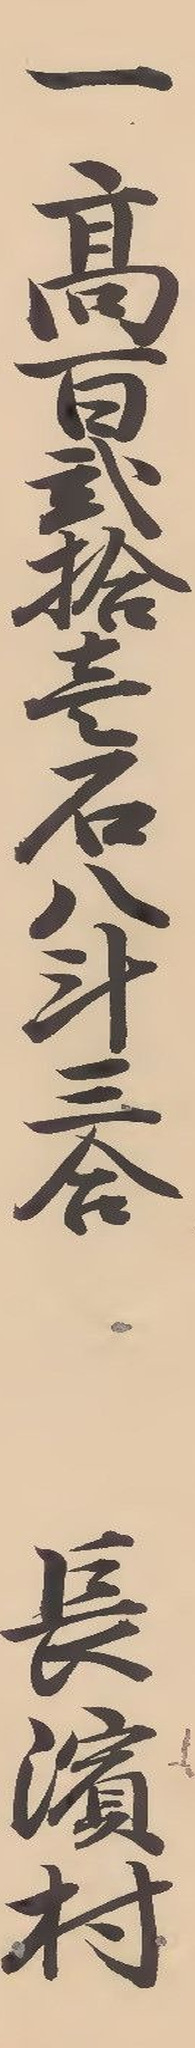一高百弐拾壱石八斗三合長浜村
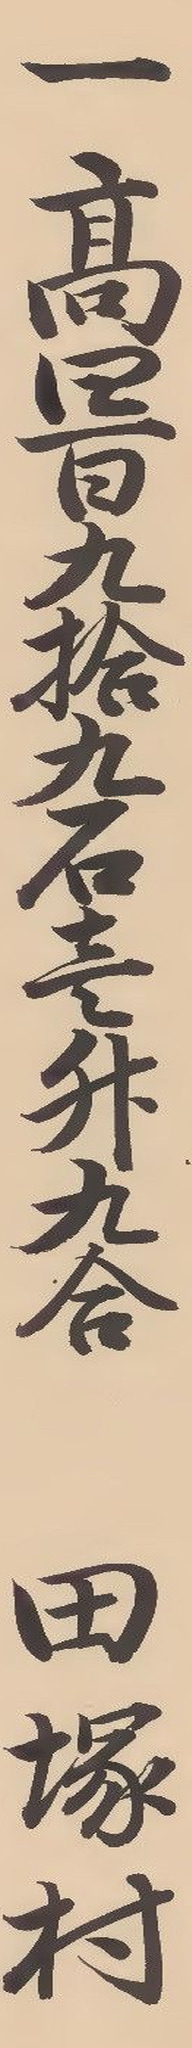一高四百九拾九石壱升九合田塚村
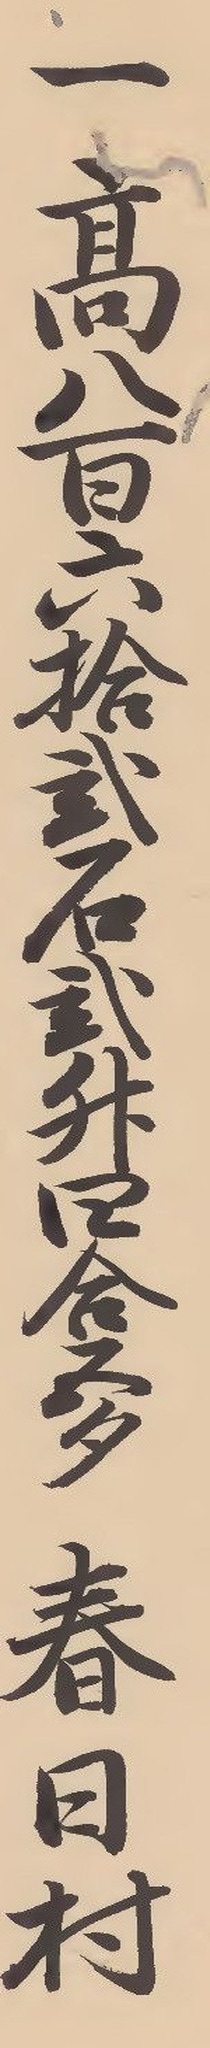一高八百六拾弐石弐升四合五勺春日村
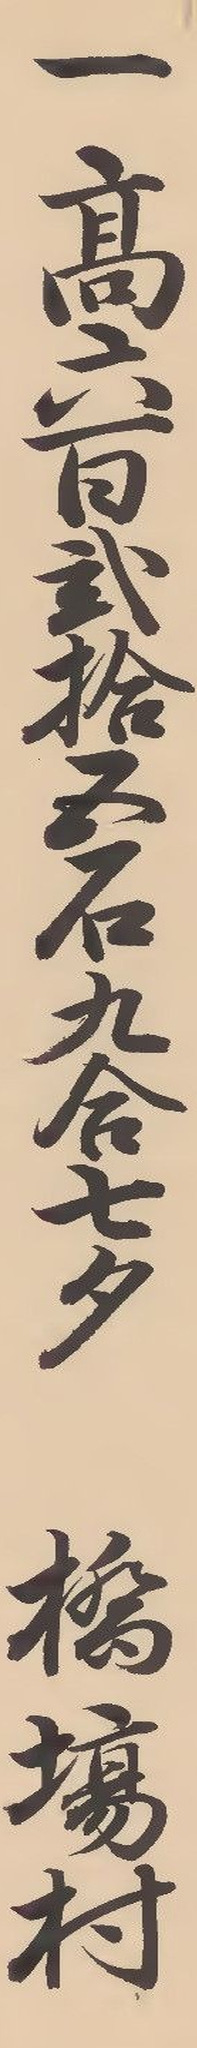一高六百弐拾五石九合七勺橋場村
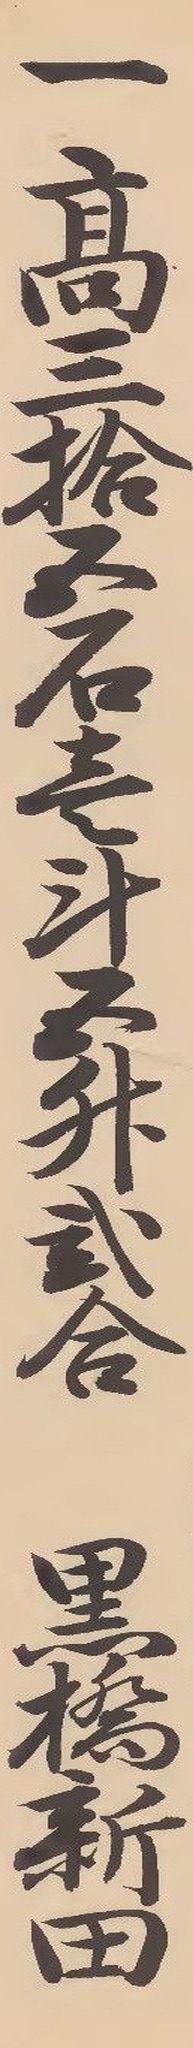一高三拾五石壱斗五升弐合黒橋新田
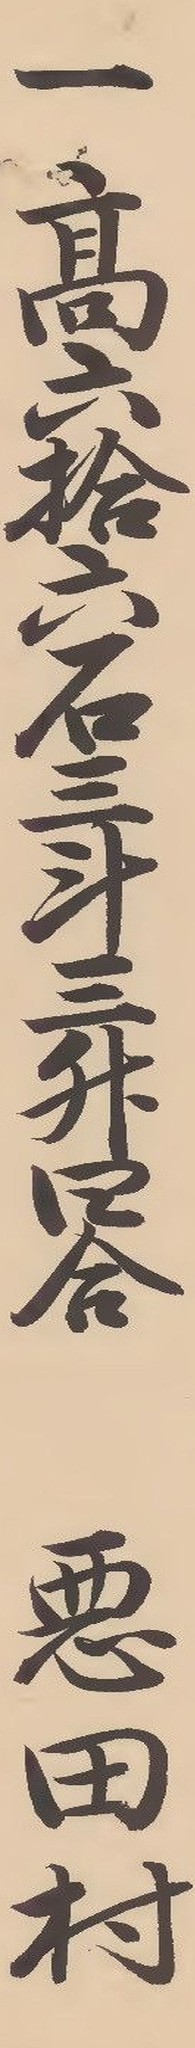一高六拾六石三斗三升四合悪田村
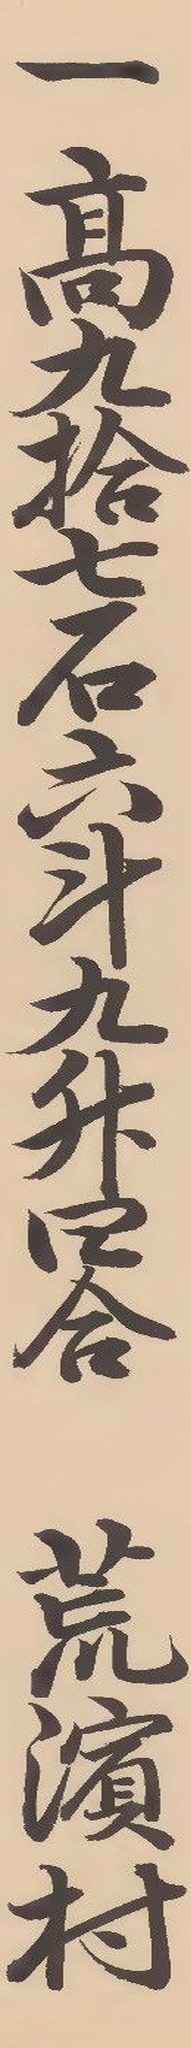一高九拾七石六斗九升四合荒浜村
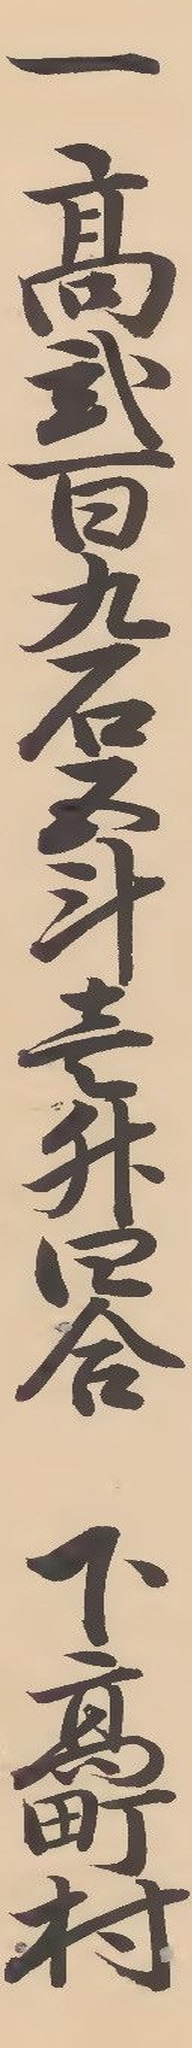一高弐百九石五斗壱升四合下高町村

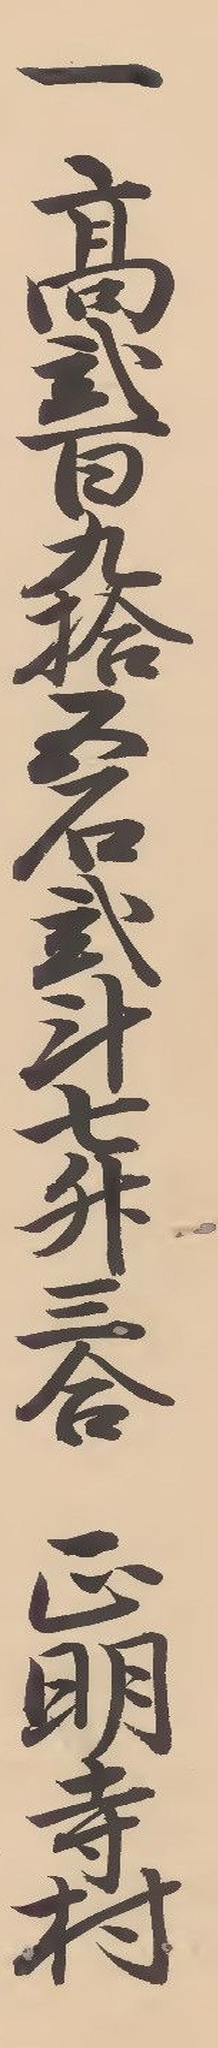一高弐百九拾五石弐斗七升三合正明寺村
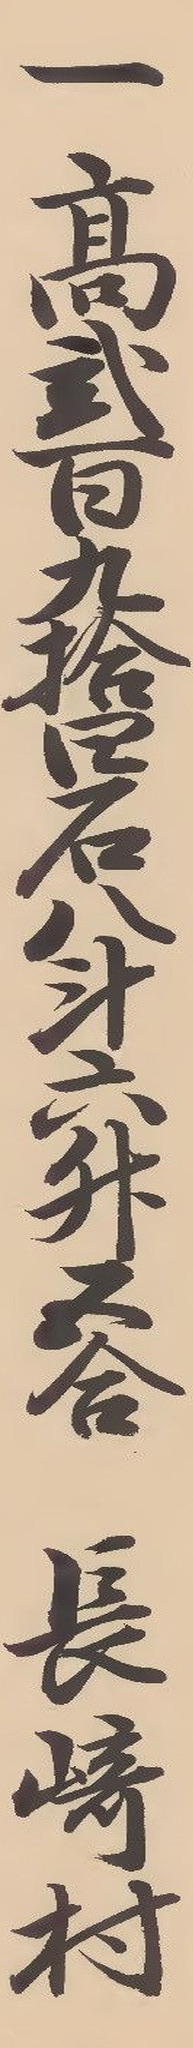一高弐百九拾四石八斗六升五合長崎村
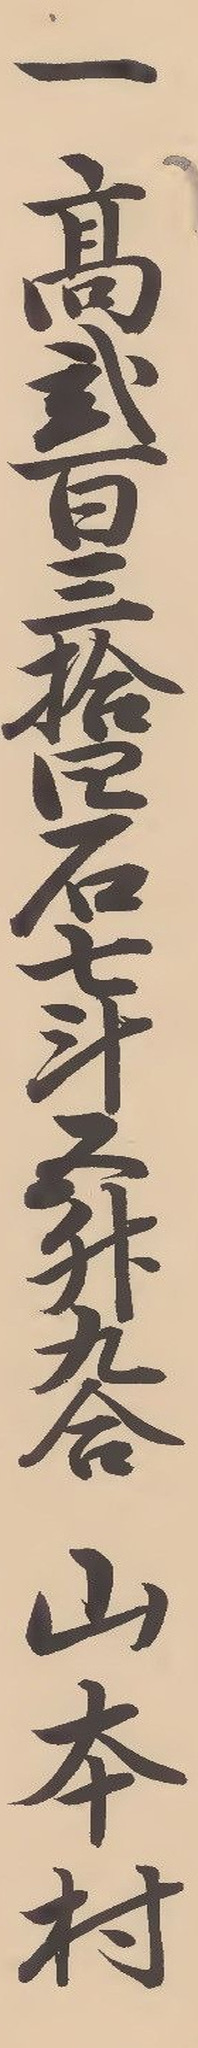一高弐百三拾四石七斗五升九合山本村
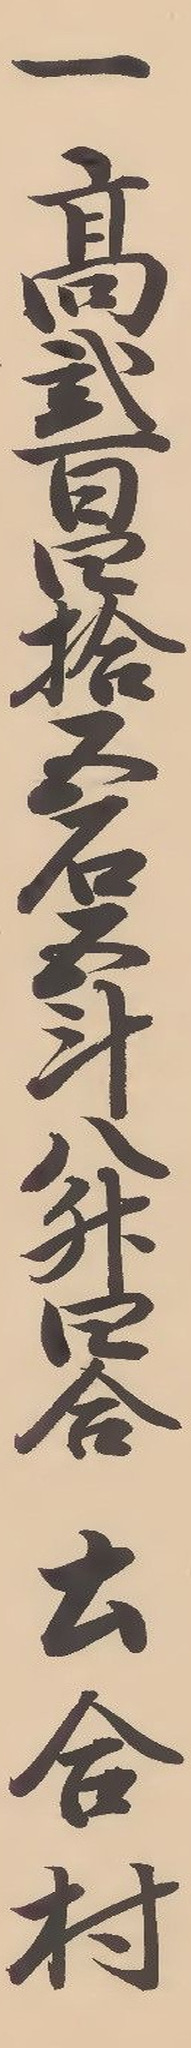一高弐百四拾五石五斗八升四合土合村
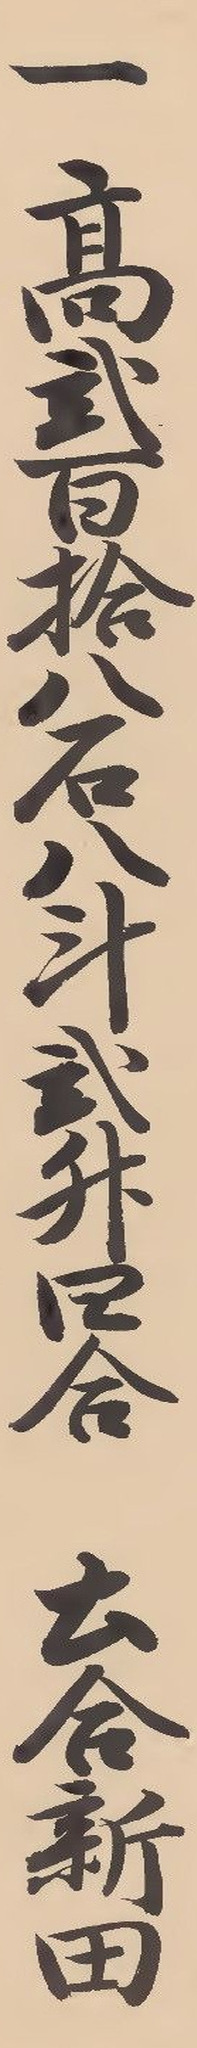一高弐百拾八石八斗弐升四合土合新田
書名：越後国郷帳　中
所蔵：国立公文書館 National Archives of Japan
